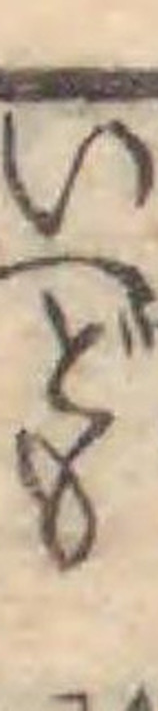いへども
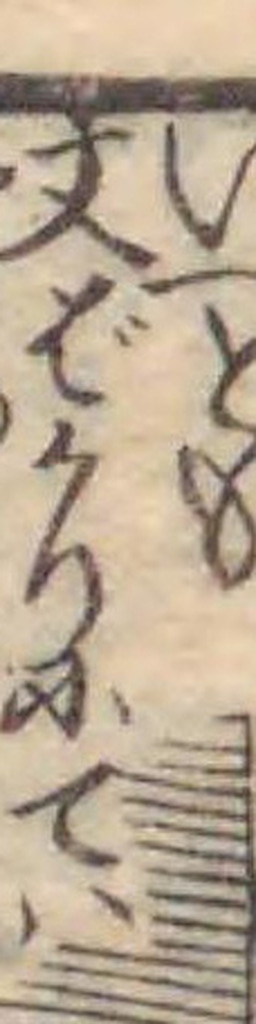文ばかりにては
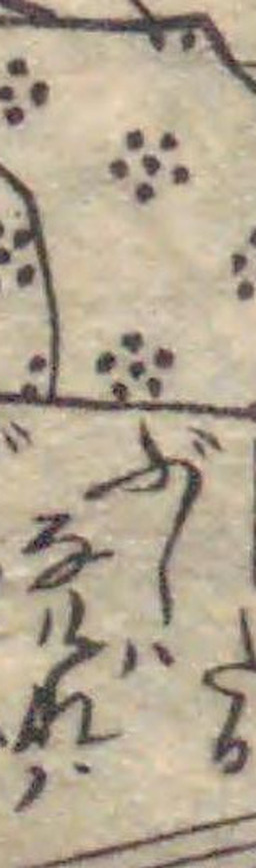なければ
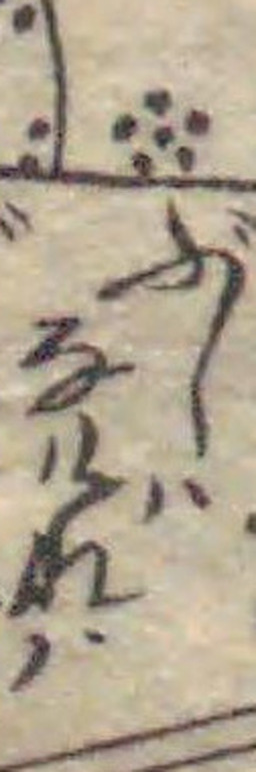なければ
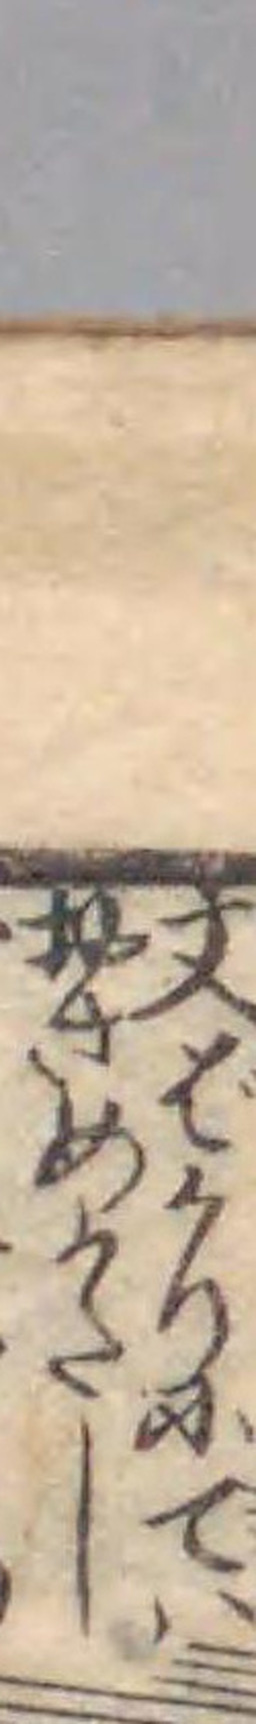おさめかたし
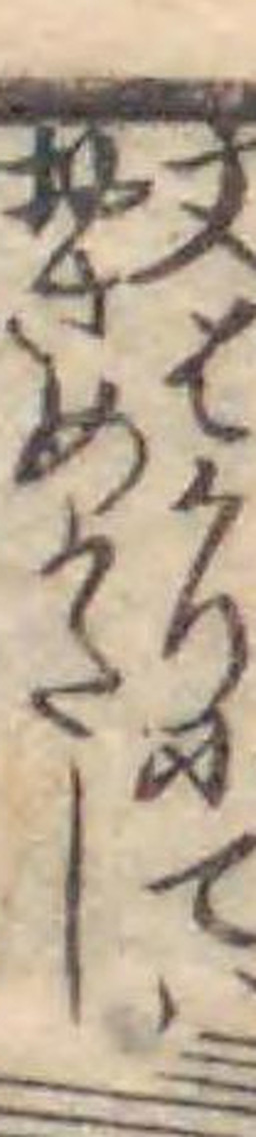おさめかたし
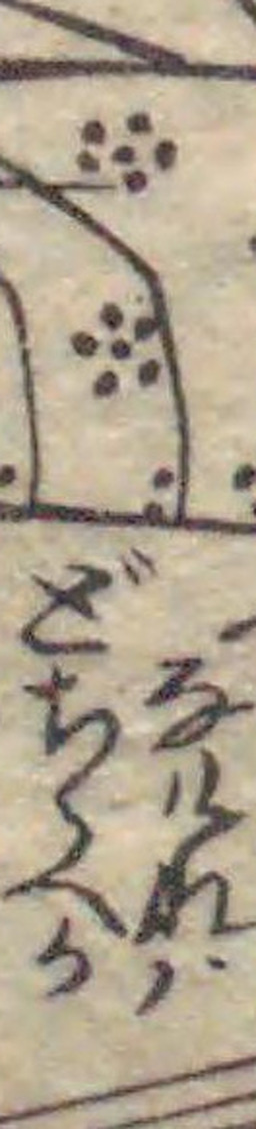どちらへか
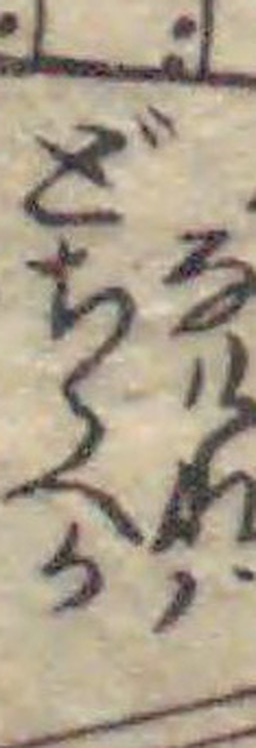どちらへか
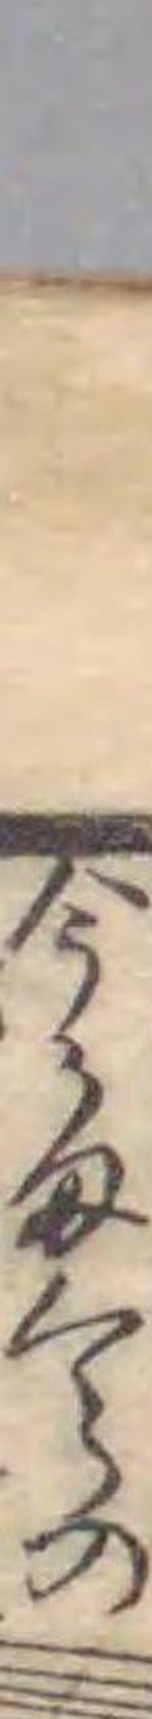今かまくらの
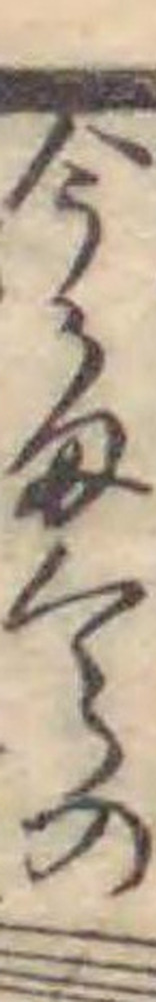今かまくらの
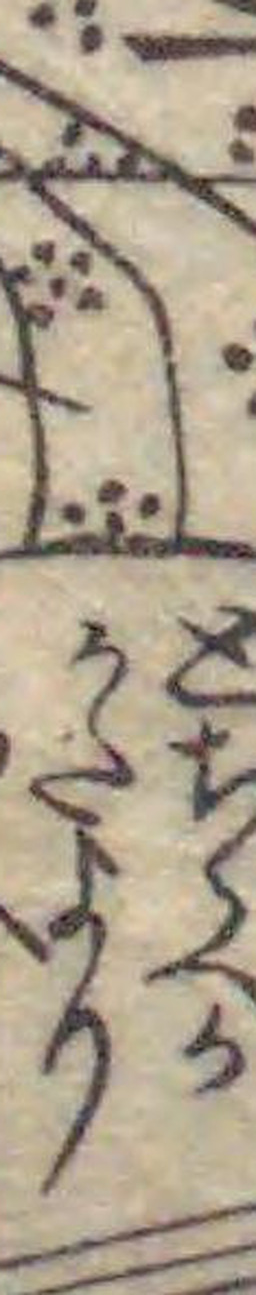かたより
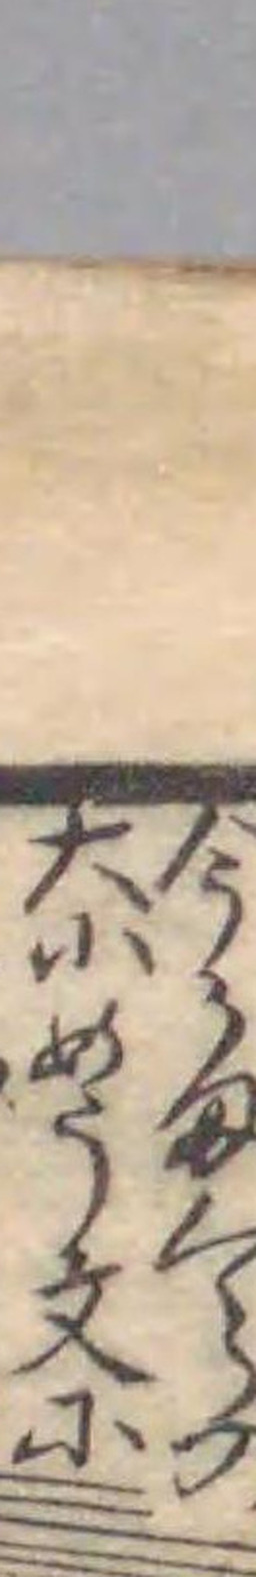大小めう文に
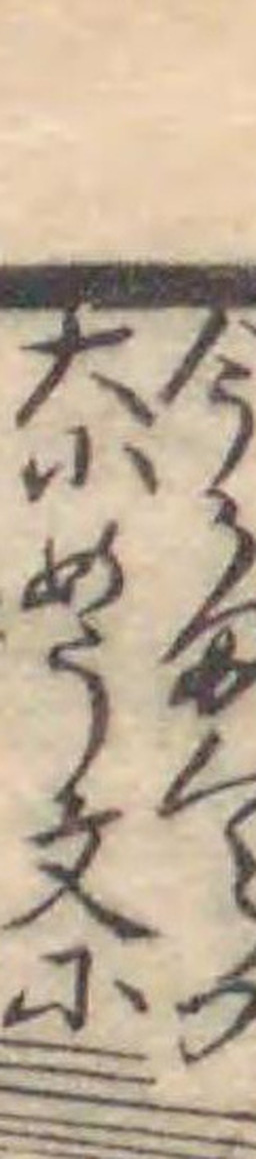大小めう文に
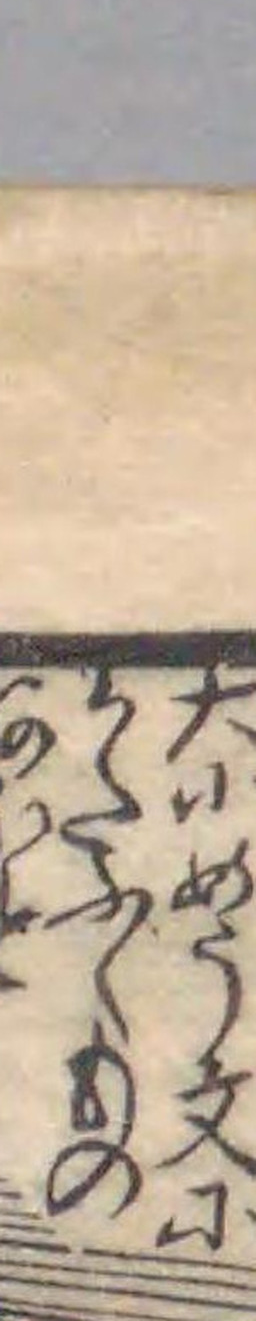かたふくもの
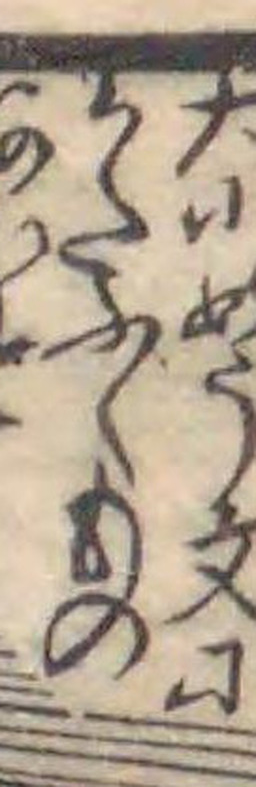かたふくもの
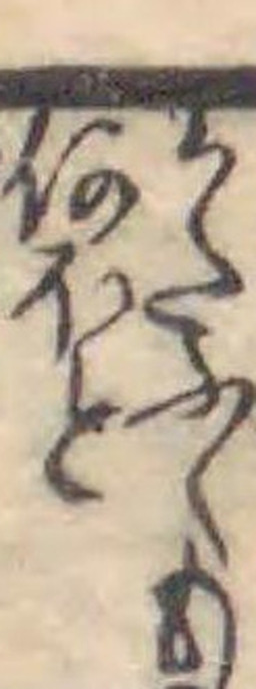何ほと
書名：文武二道万石通 : 3巻
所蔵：国立国会図書館 National Diet Library, JAPAN
